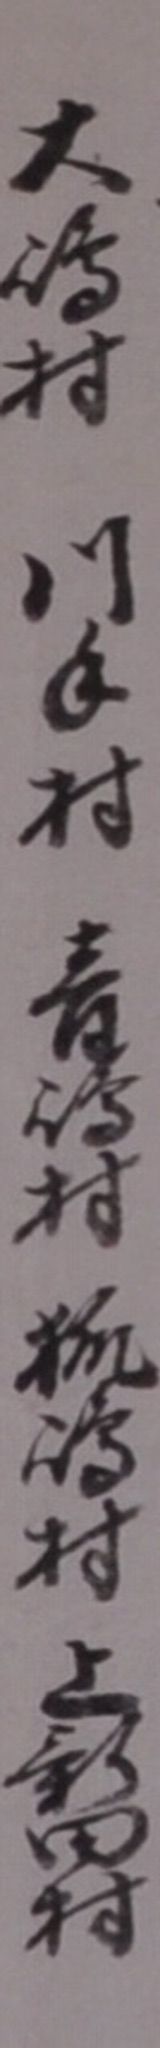大島村川手村青島村狐島村上新田村
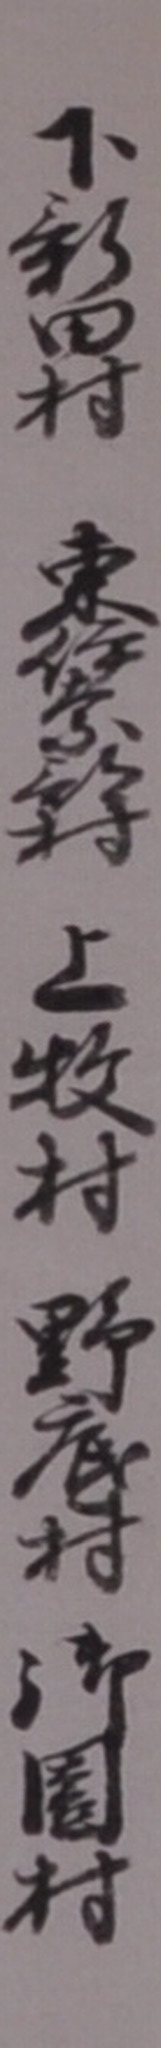下新田村東伊奈部村上牧村野底村御園村
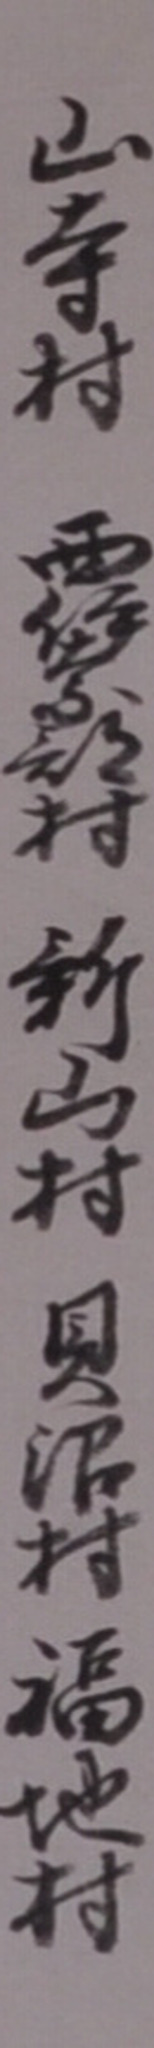山寺村西伊奈部村新山村貝沼村福地村
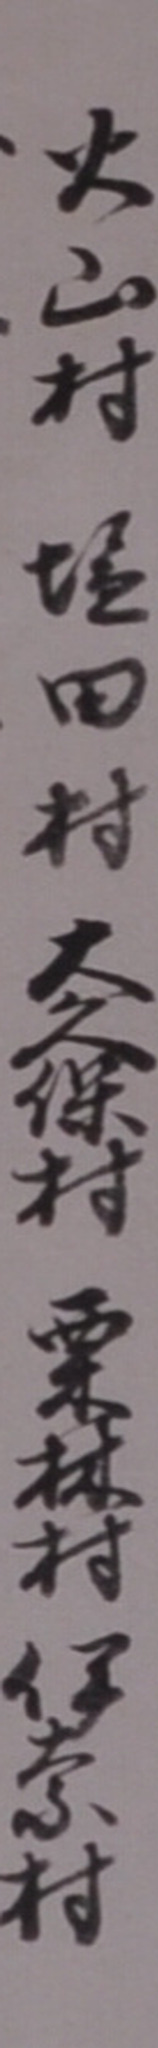火山村塩田村大久保村栗林村伊奈村
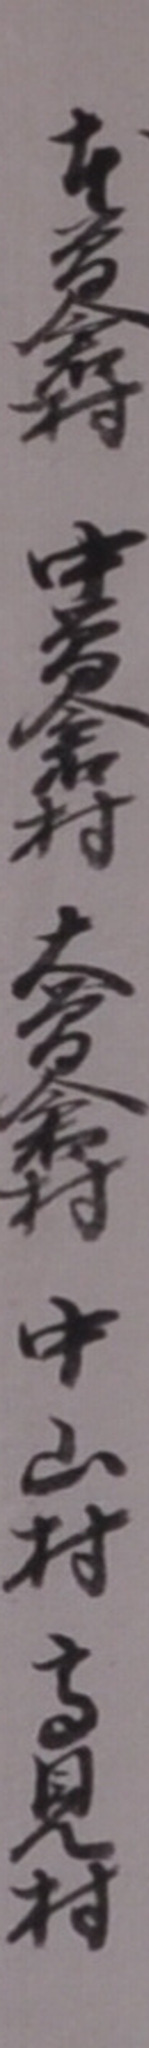本曽倉村中曽倉村大曽倉村中山村高見村
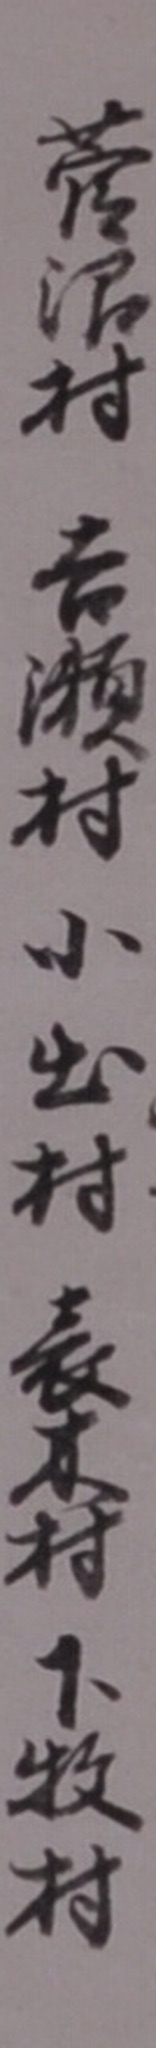菅沼村吉瀬村小出村表木村下牧村
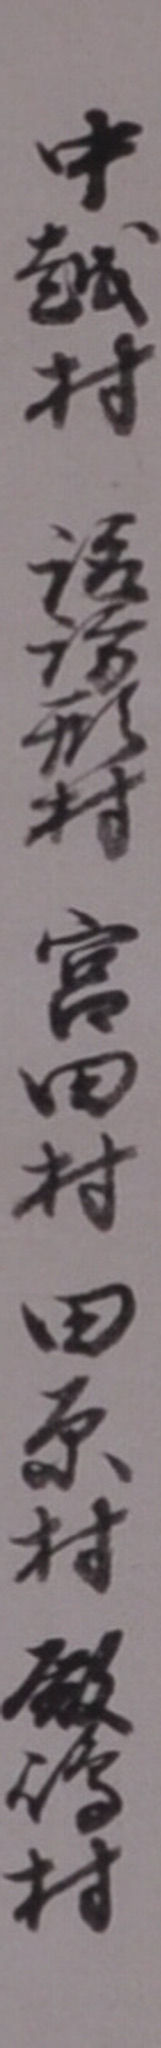中越村諏訪形村宮田村田原村殿島村
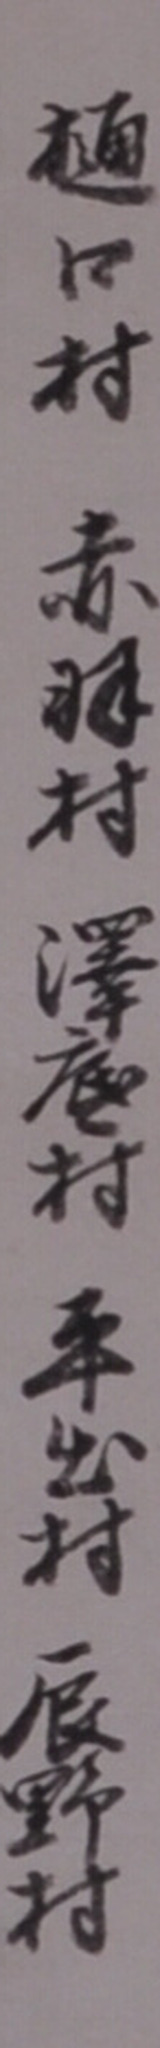樋口村赤羽村沢底村平出村辰野村
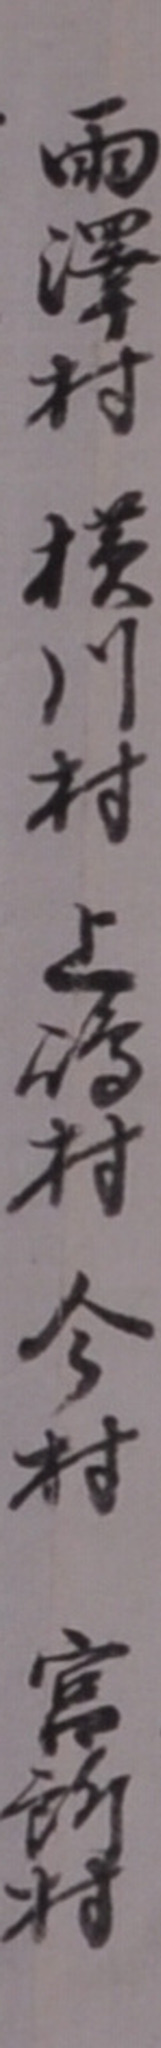雨沢村横川村上島村今村宮所村
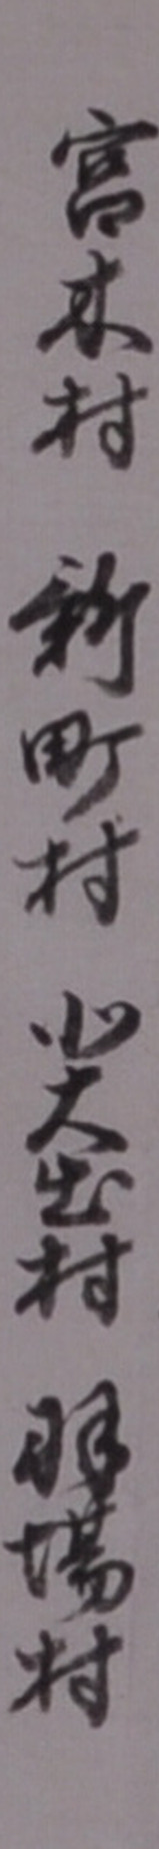宮木村新町村北大出村羽場村
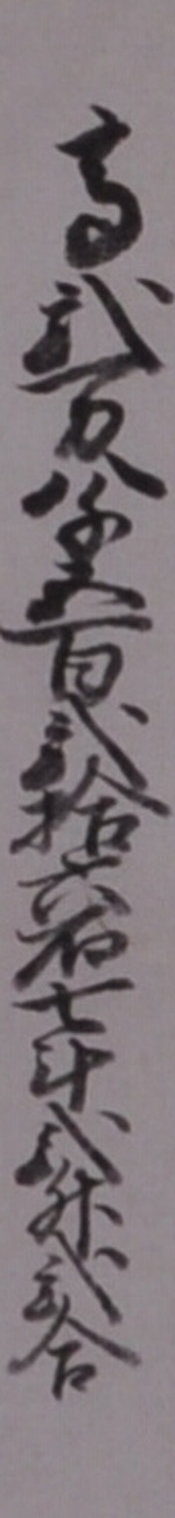高弐万八千五百弐拾六石七斗弐升弐合
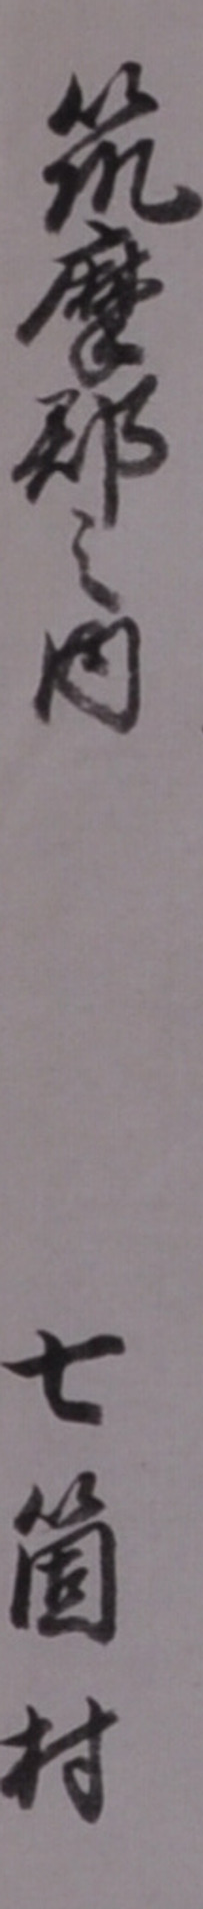筑摩郡之内七箇村
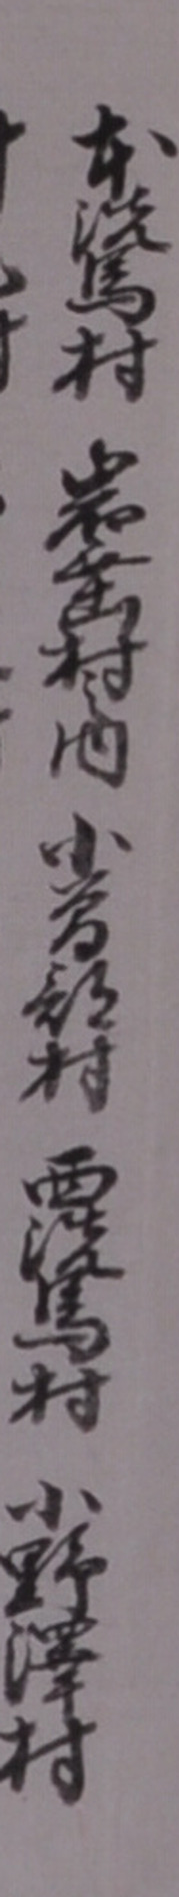本洗馬村岩垂村之内小曽部村西洗馬村小野沢村
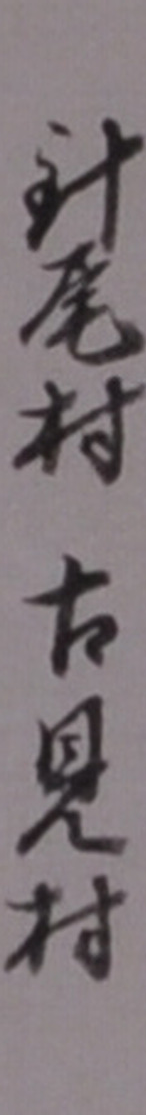針尾村古見村
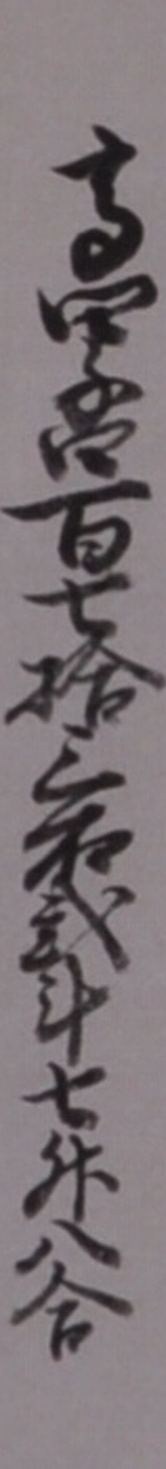高四千四百七拾三石弐斗七升八合
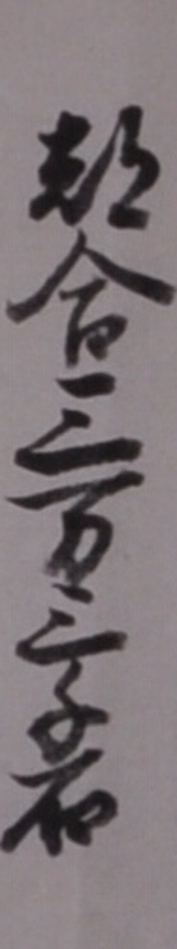都合三万三千石
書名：御朱印写・領地目録
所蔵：伊那市立高遠町図書館・合同会社AMANE
